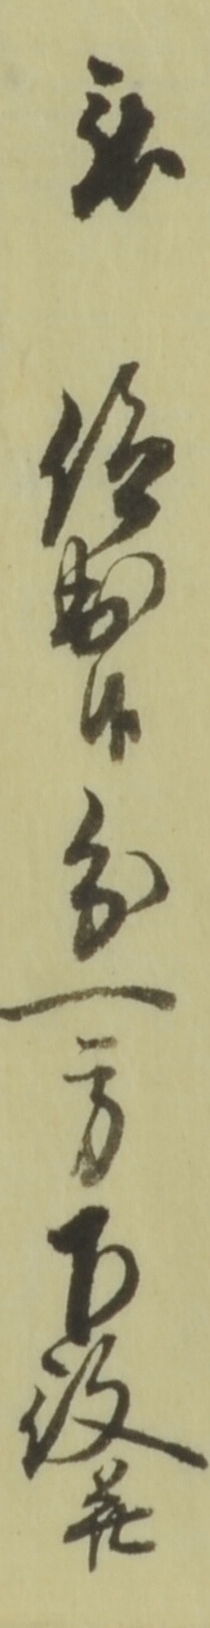被仰出候分一方下役并
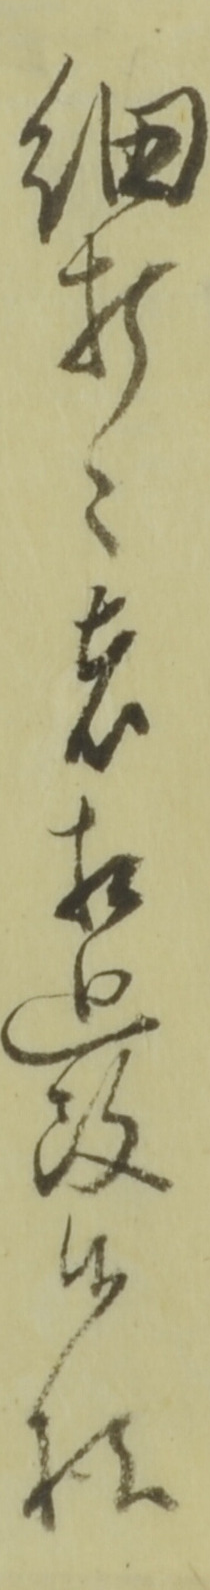細折々は相廻改候様
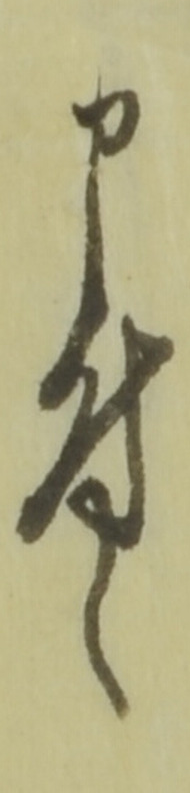申付候
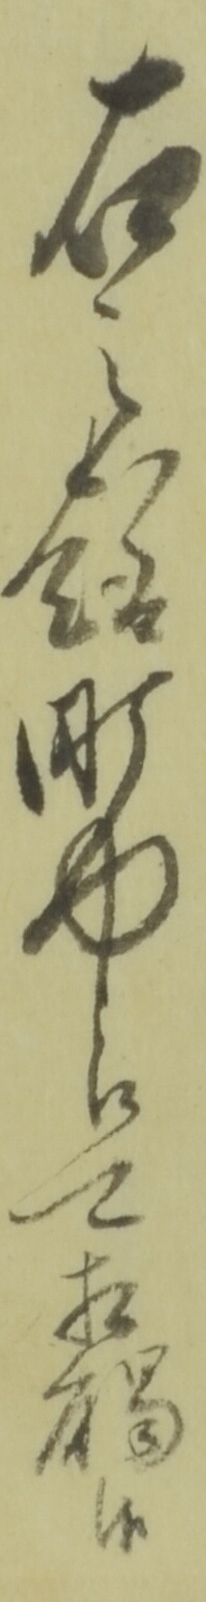右之趣町中江可相触候
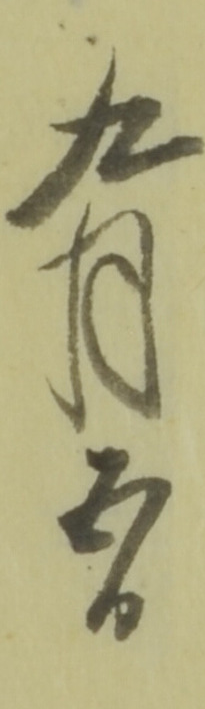九月五日
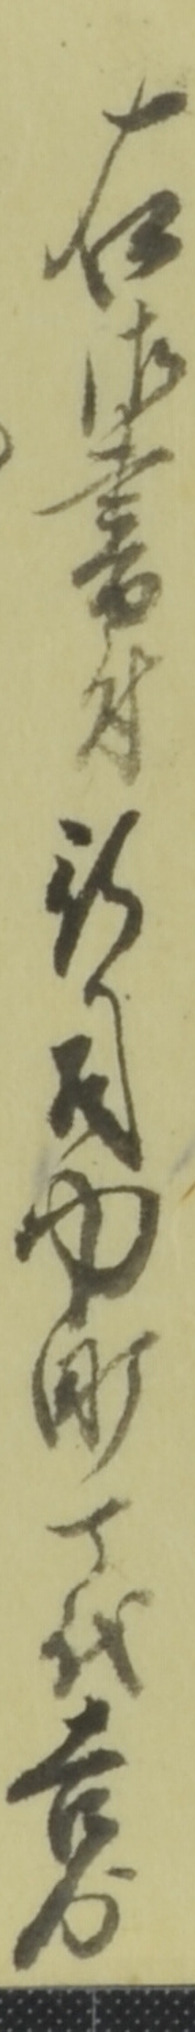右御書付行司中町丁代吉右衛門
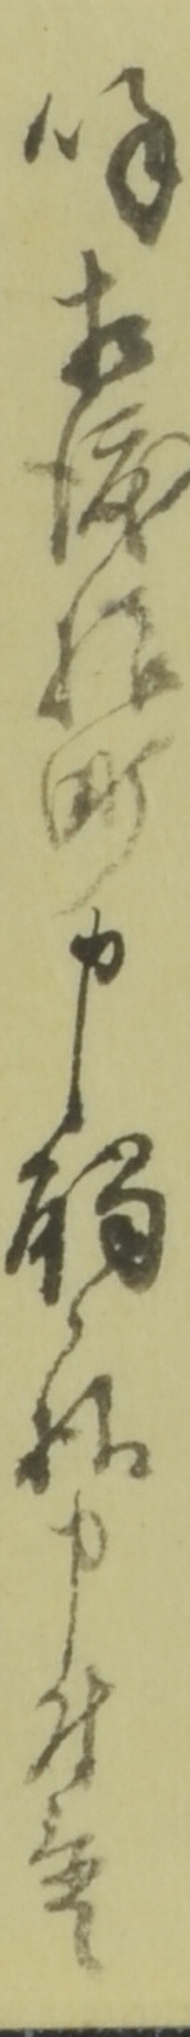呼相渡拾町申触候様申付置候

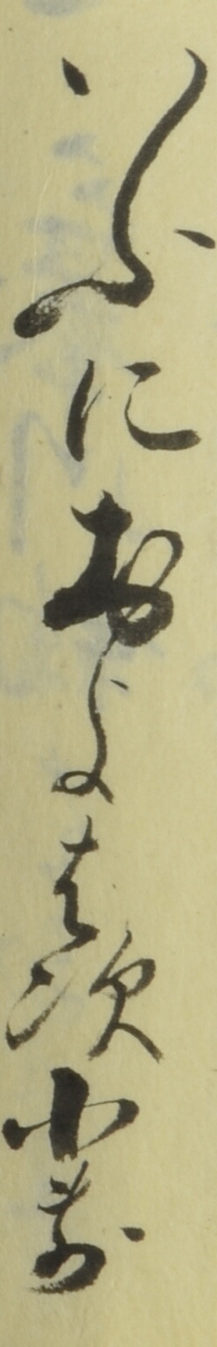いふにおよはす小前
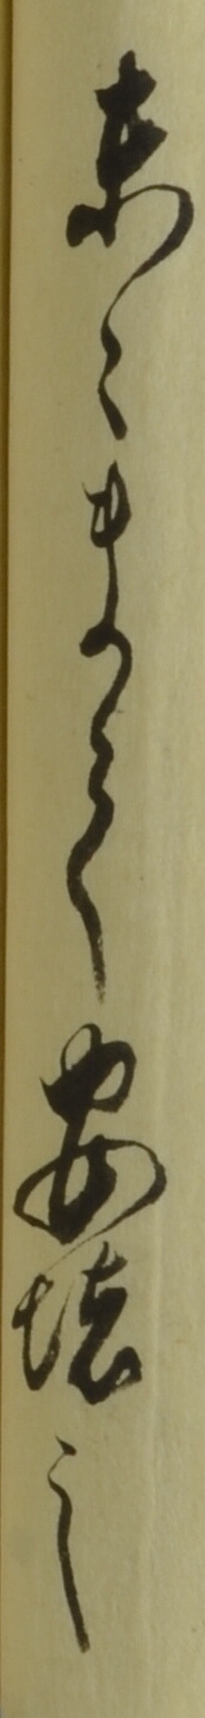末々まて安堵之
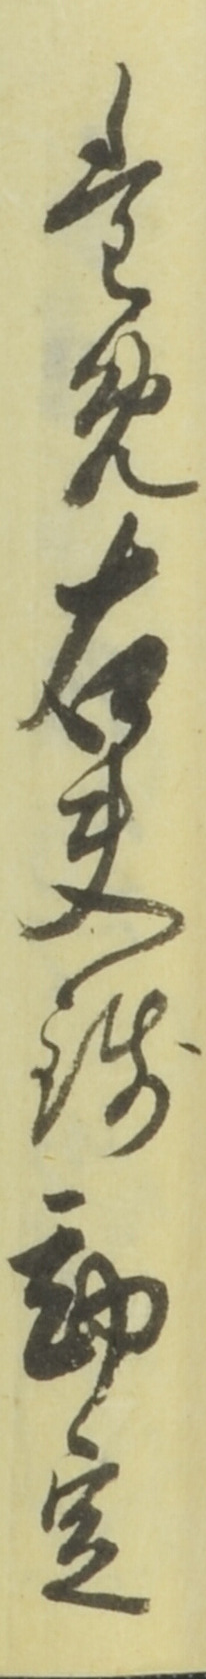ため右夫銭勘定
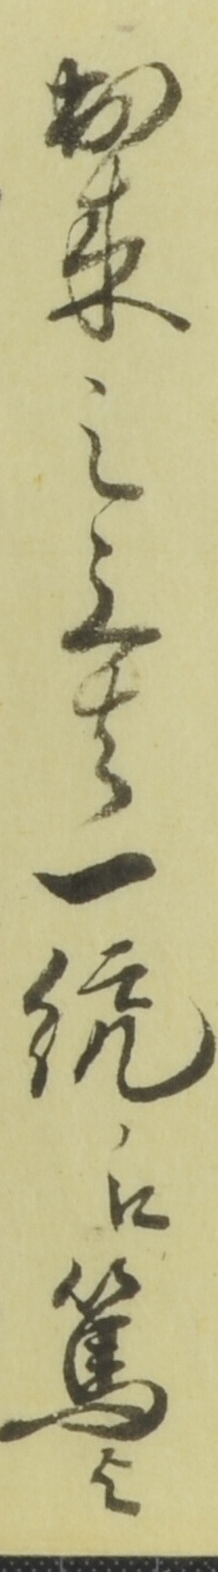出来之上は一統江篤と
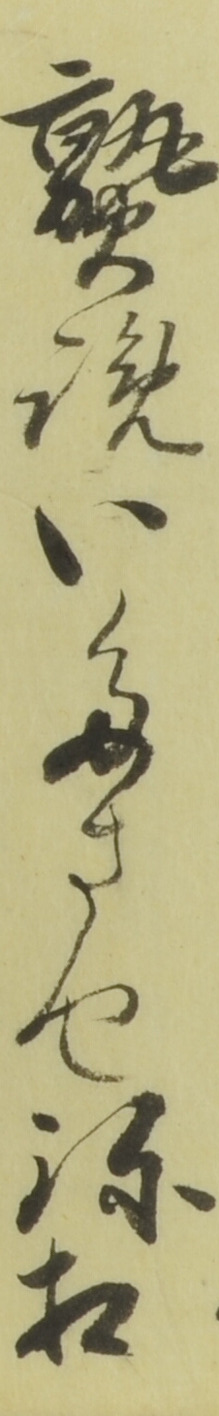熟覧いたさせ弥相
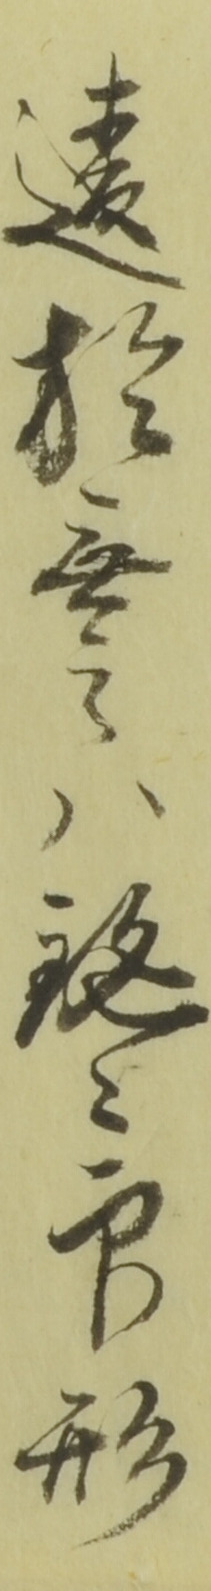違於無之ハ銘々印形
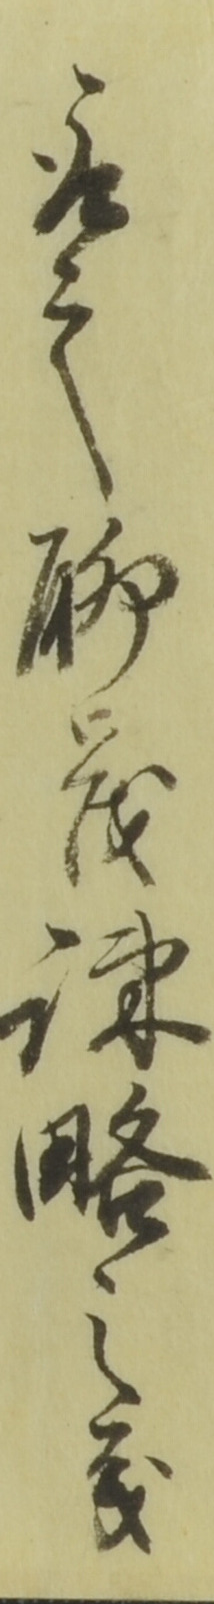取之聊も粗略之義
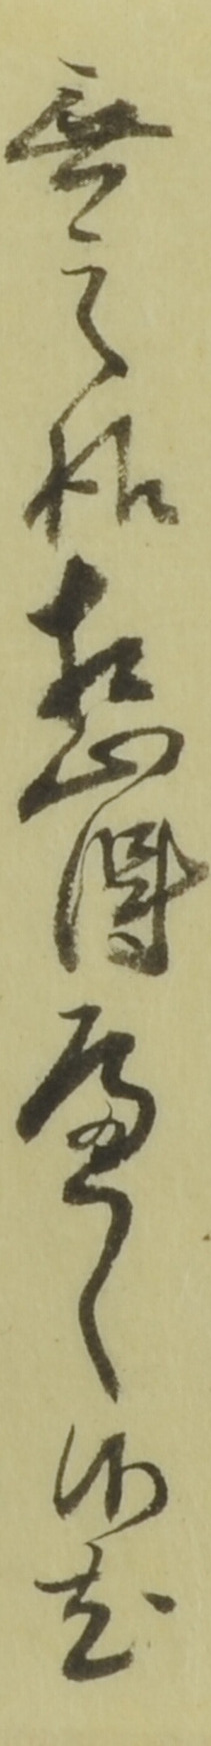無之様相心得へく候尤
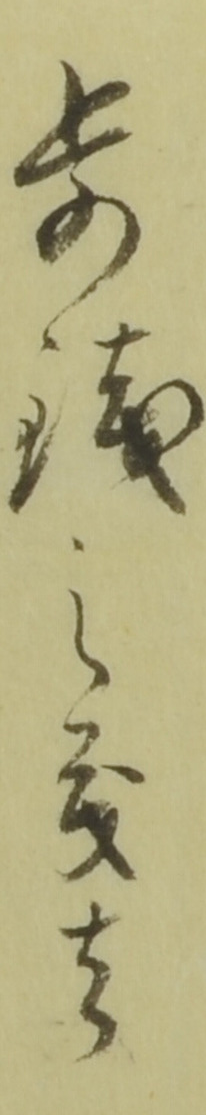歩銭之義は
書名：御触書御書附控
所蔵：伊那市立高遠町図書館・合同会社AMANE
